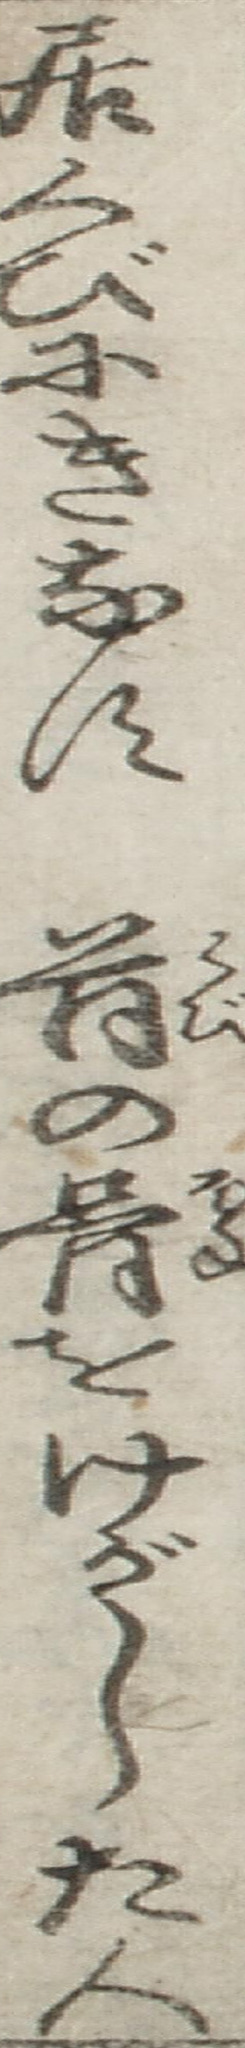居くびにきなす首の骨をけがした人

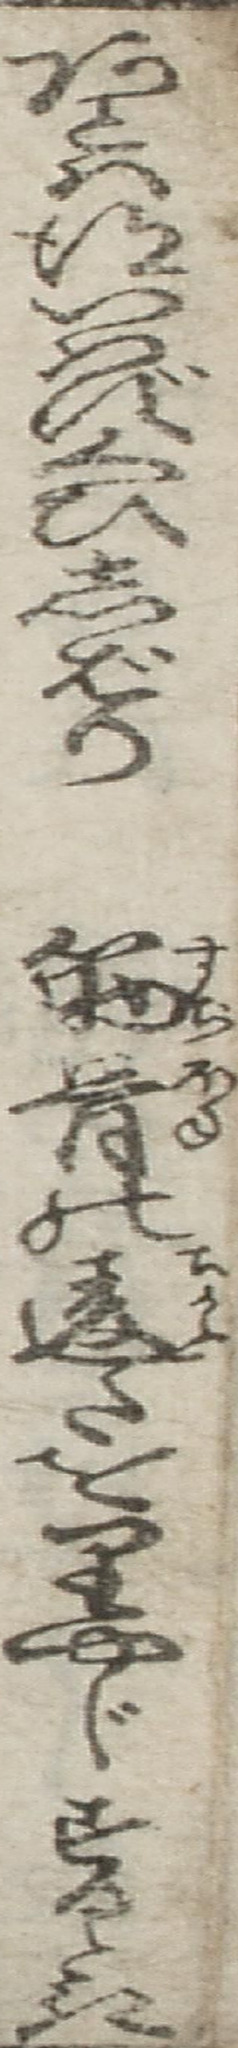あとは得いはずくひしばり筋骨の違たをりやじするとき
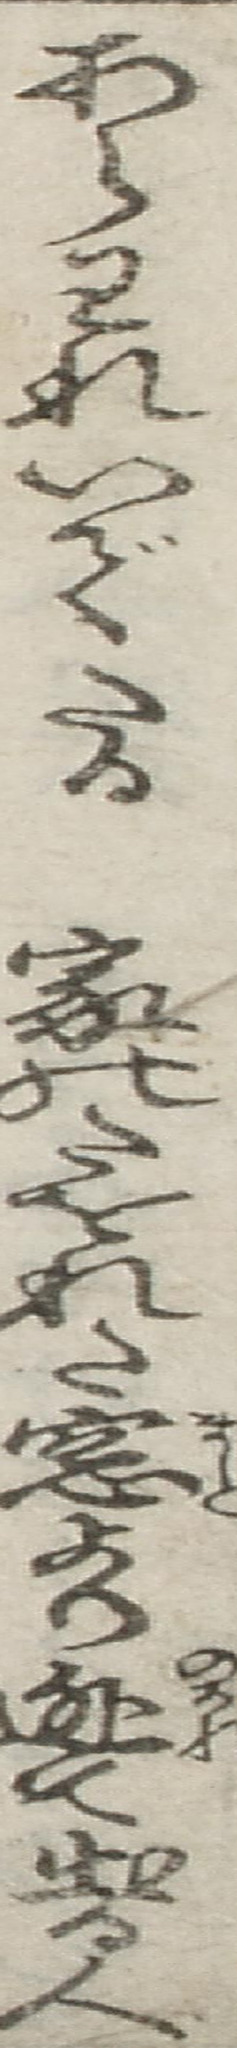あらわれいでたる家のたをれた窓より逃て出る人
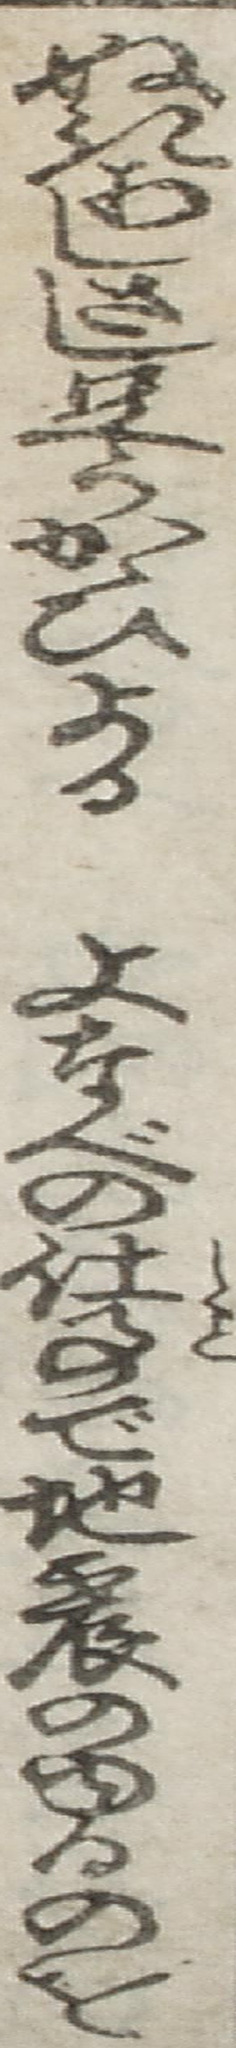ぬきあしさし足うかゝひよるよなべの仕事で地震のゆるのを
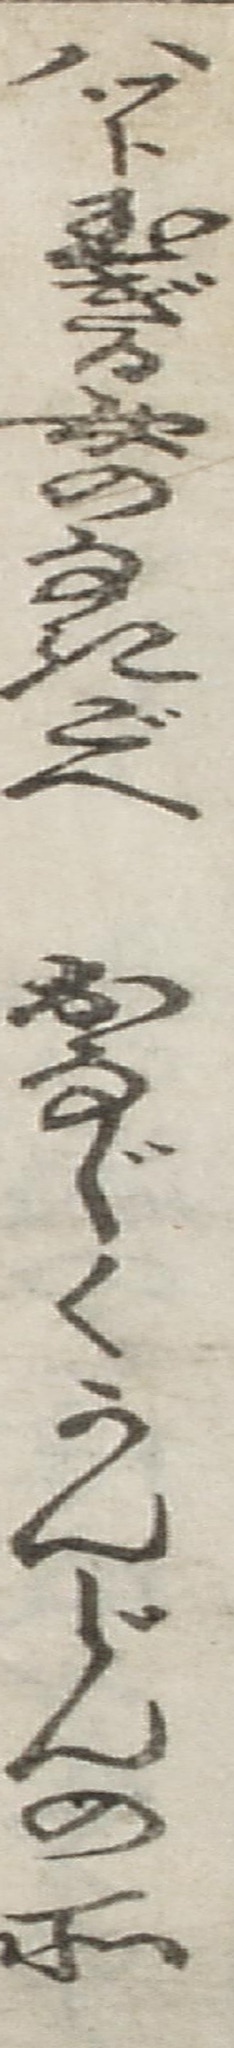ハツト玉ぎる女のなきごへおなじくかんじんの所
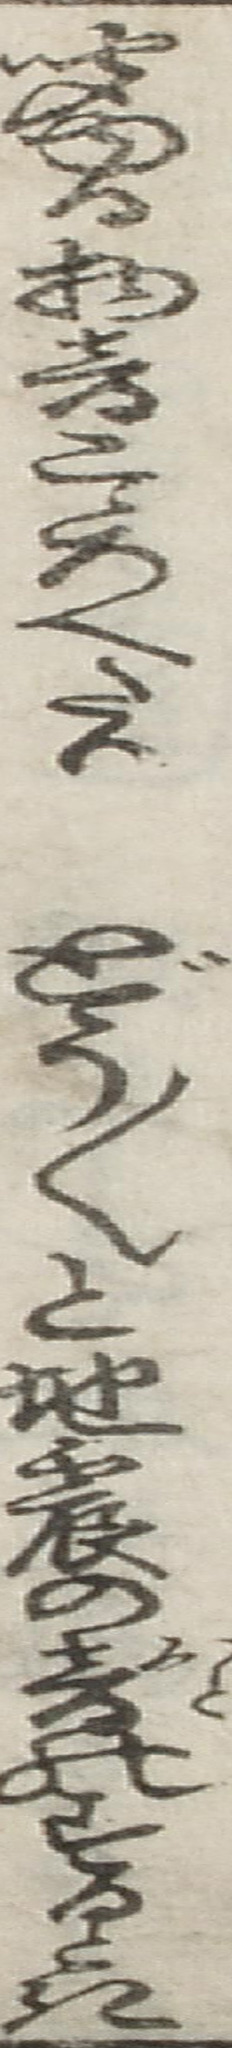聞ゆる物音こゝろへたりどう〳〵と地震の音のするとき
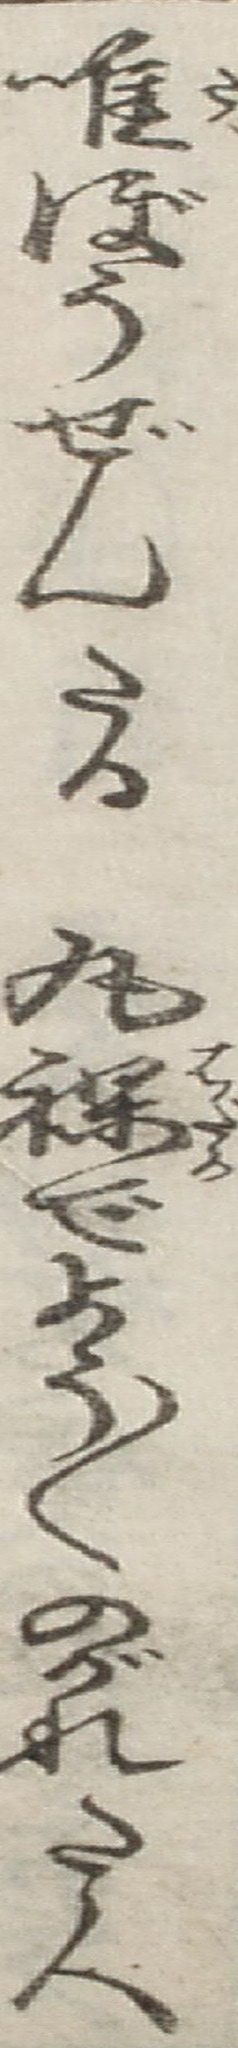唯ぼうぜんたる丸裸でよう〳〵のがれた人
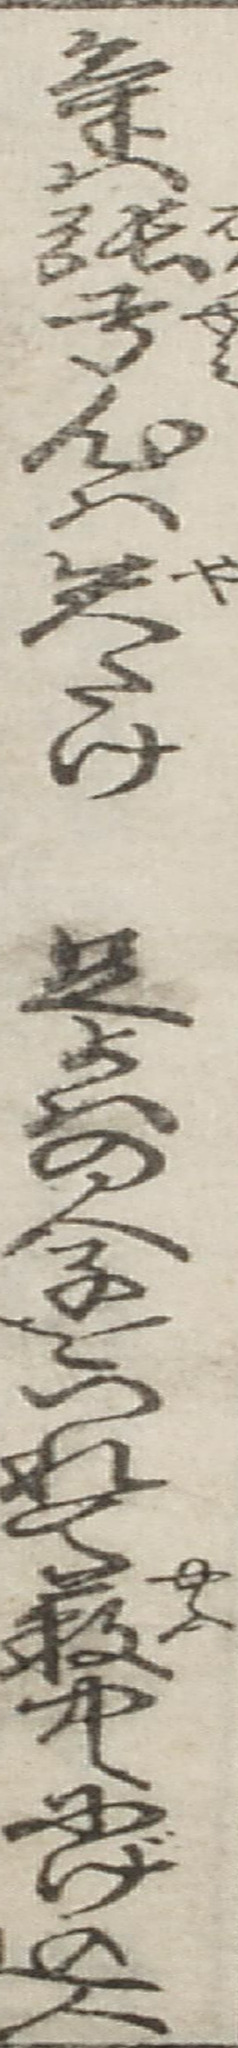気は張弓心は矢たけ足よはの人子をいれて藪中へにけ込人
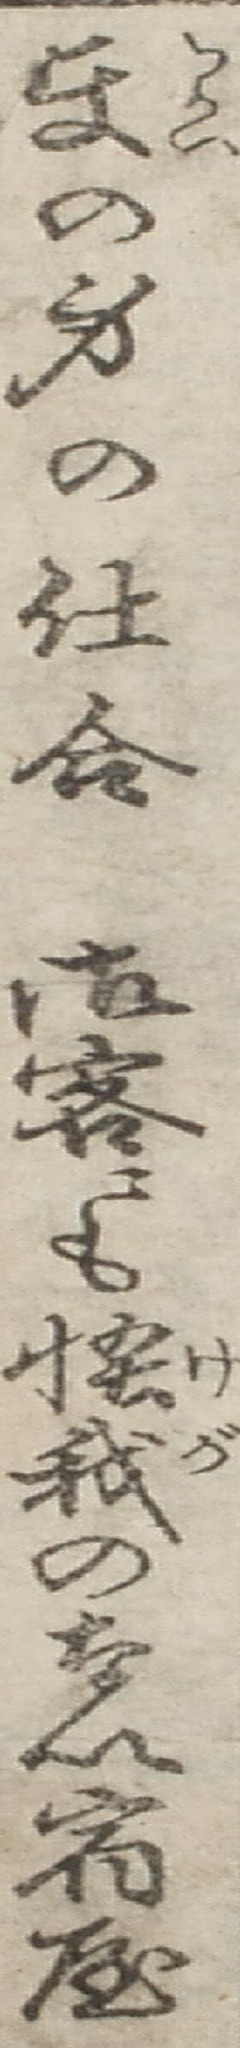互の身の仕合御客にも怪我のない宿屋
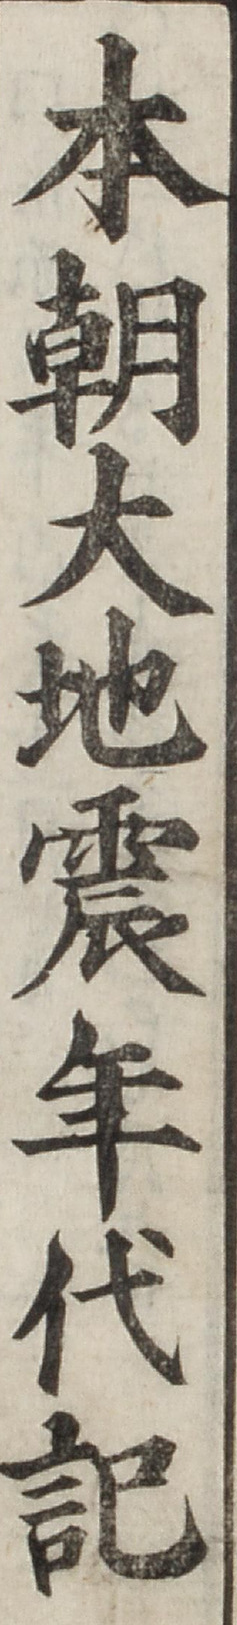本朝大地震年代記
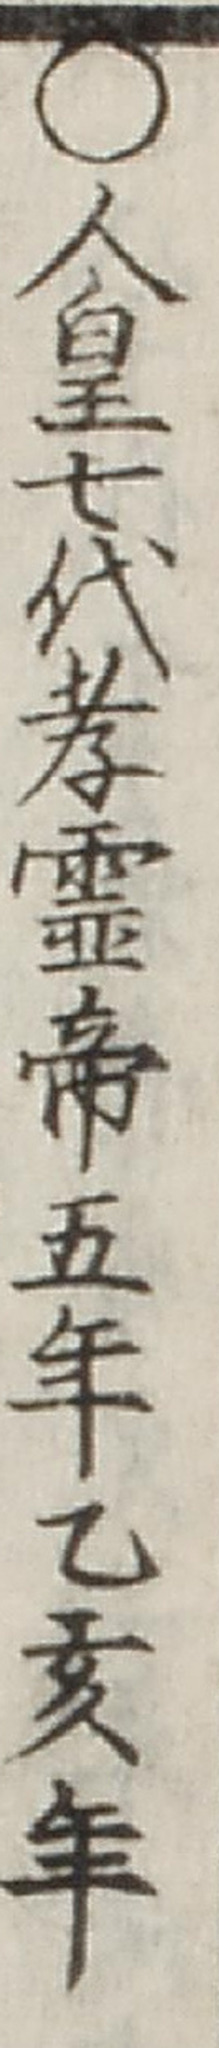○人皇七代孝霊帝五年乙亥年
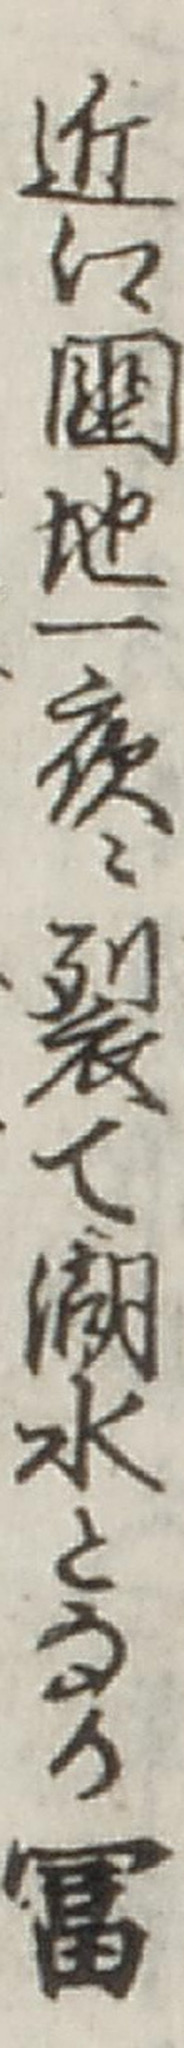近江国地一夜に裂て湖水となり冨
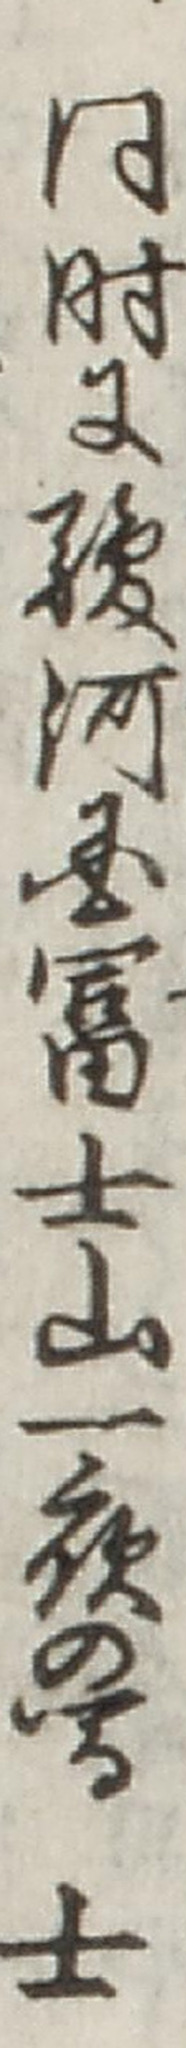同時に駿河国冨士山一夜の間士
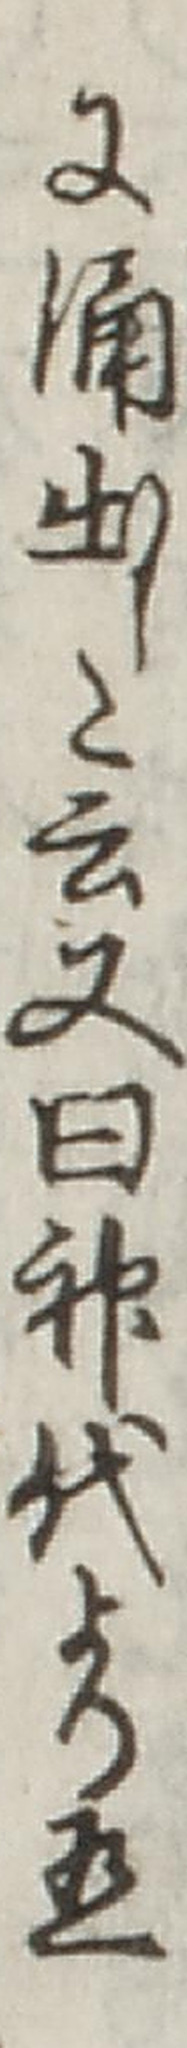に涌出しと云又曰神代より有山
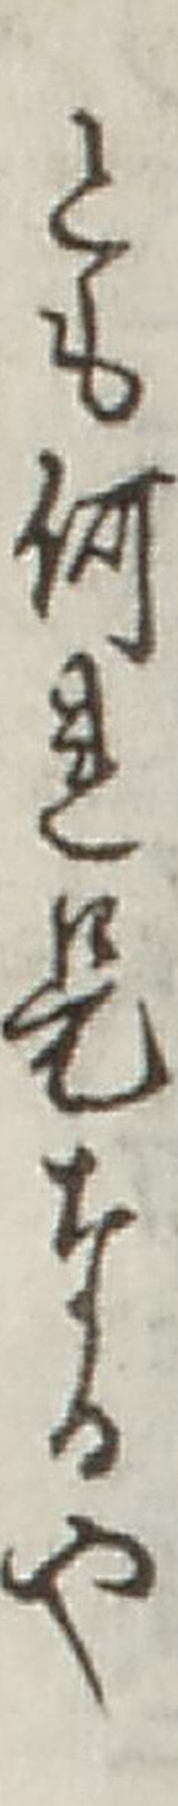とも何れ是なるや
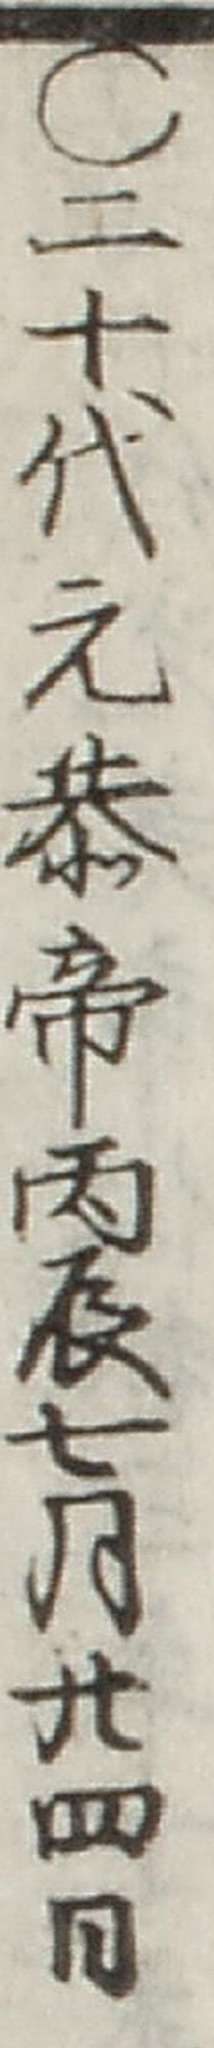○二十代元恭帝丙辰七月廿四日
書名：地震世直草紙　全
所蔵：東京大学地震研究所図書室 Earthquake Research Institute Library, The University of Tokyo, JAPAN
